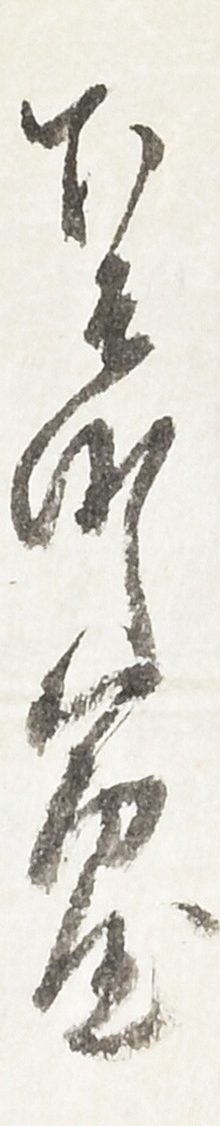下モ町冨屋

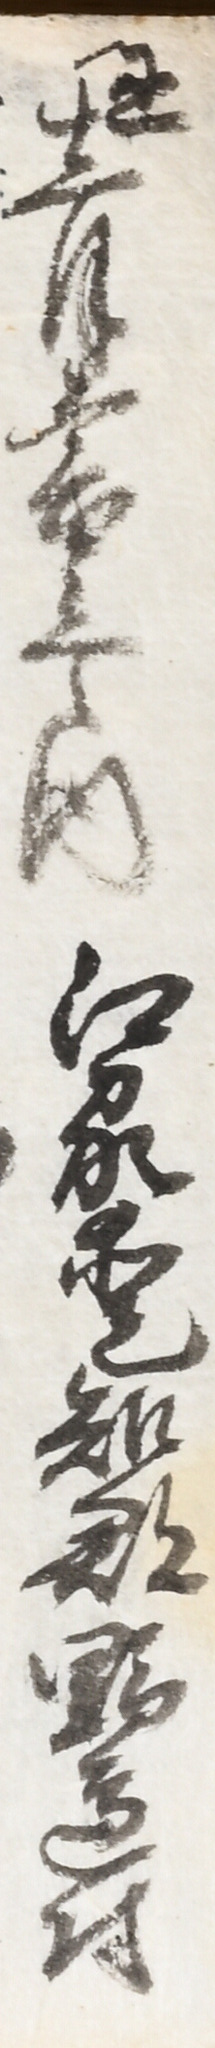十二月書上之内江州愛知郡野辺村
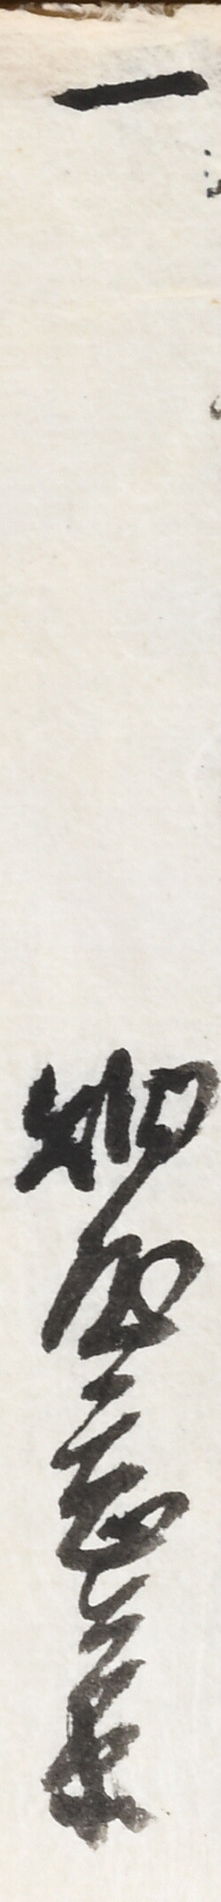一畑屋甚兵衛
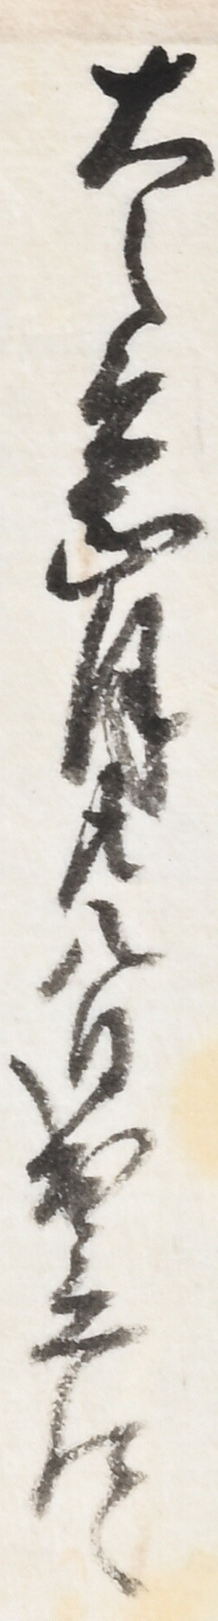右之者正月廿八日出立仕候
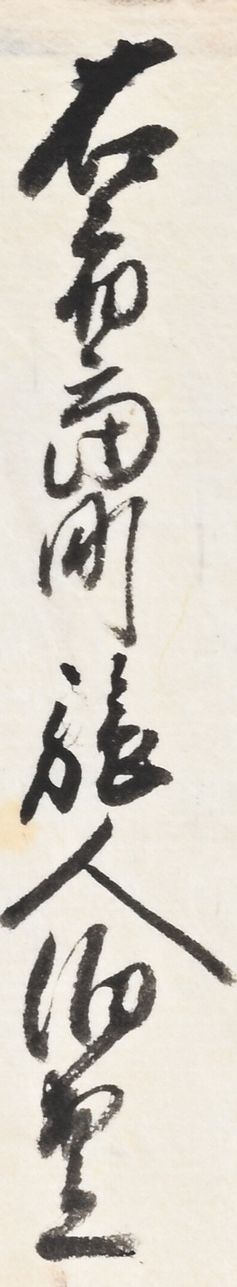右者当町旅人泊出立
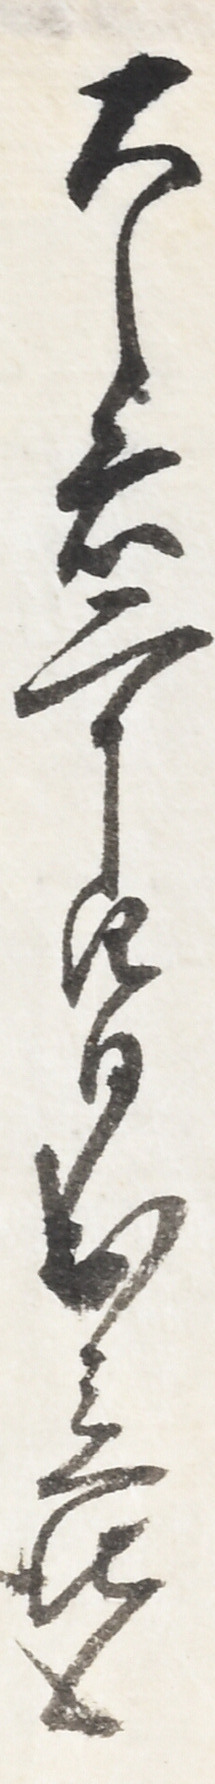右之者二月四日出立仕候
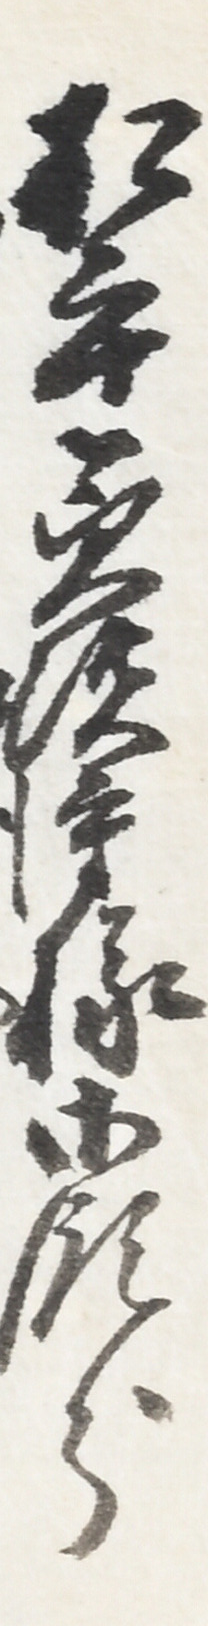松平美濃守様御領分
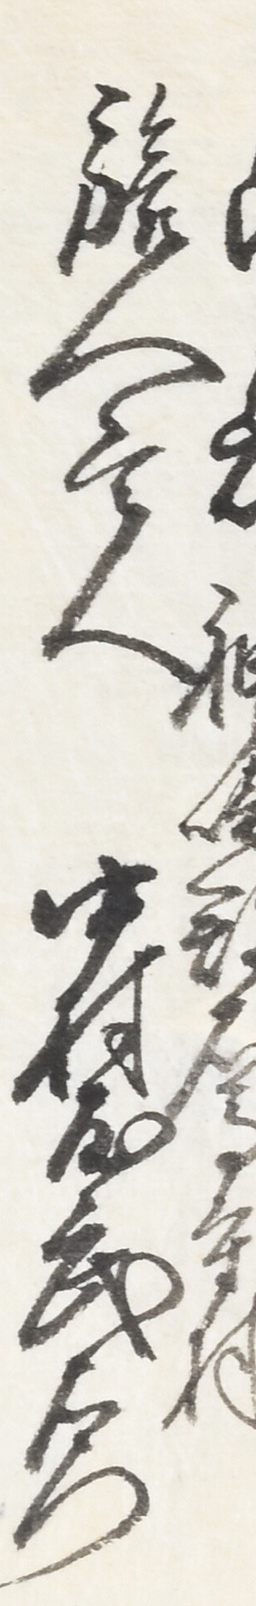一旅人壱人中村屋武右衛門
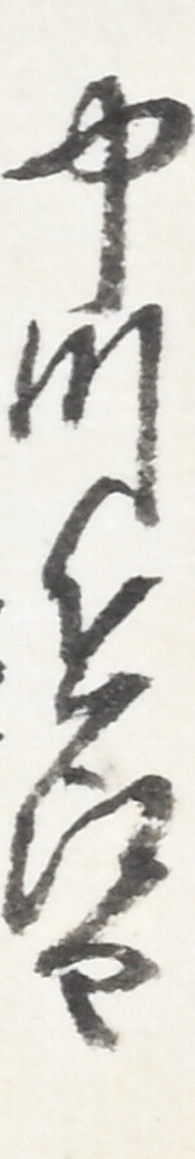中町近江屋
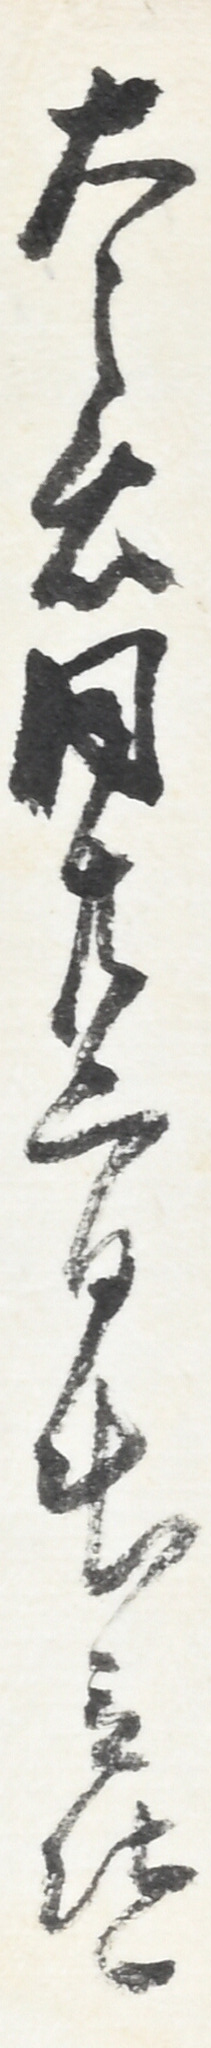右之者同廿二日出立仕候

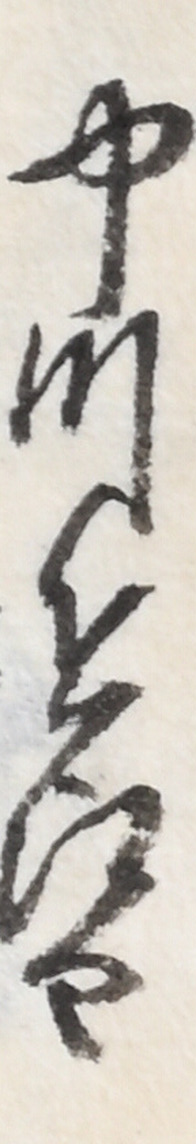中町近江屋
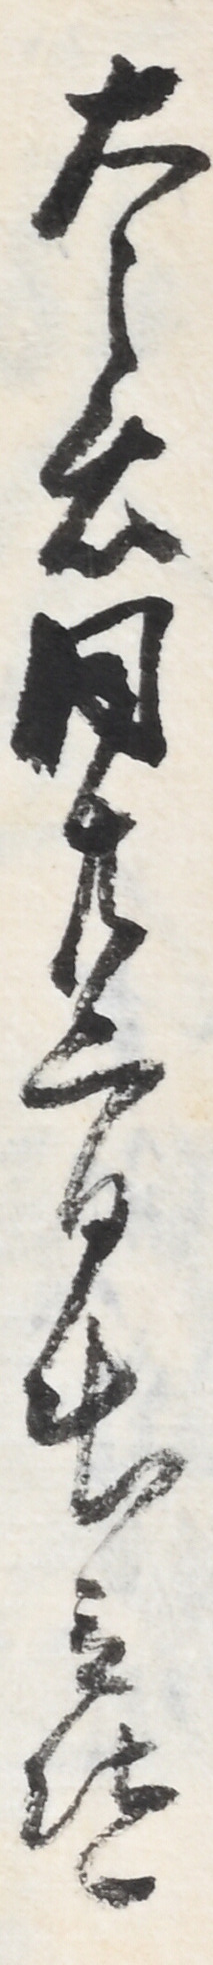右之者同十二日出立仕候
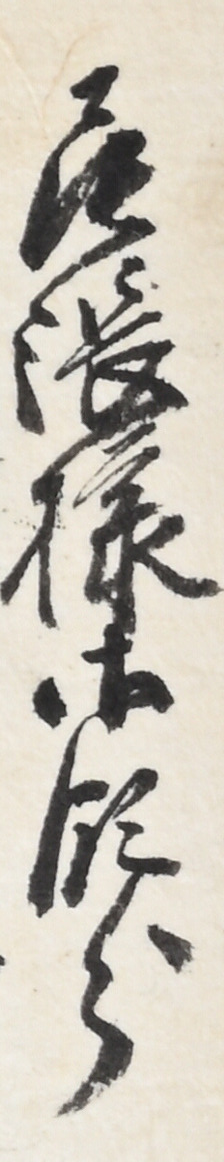尾張様御領分
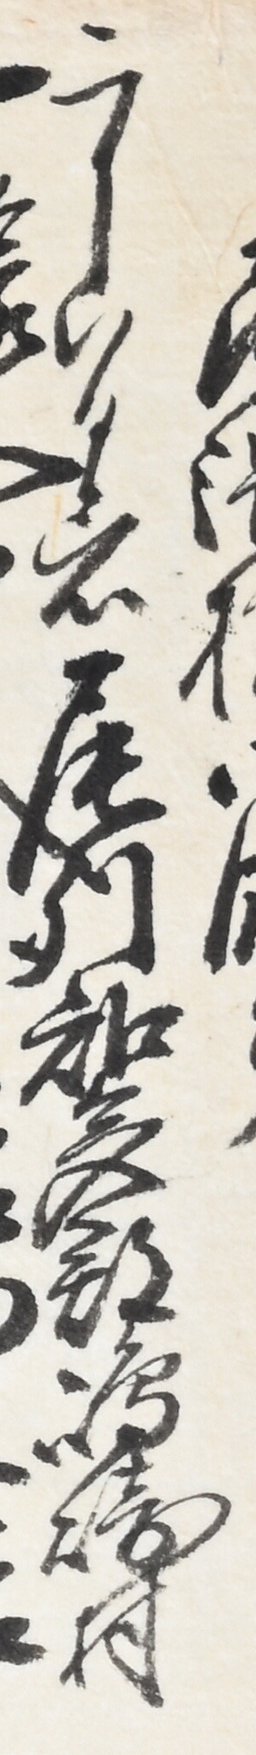二月八日着尾州知多郡嶋崎村
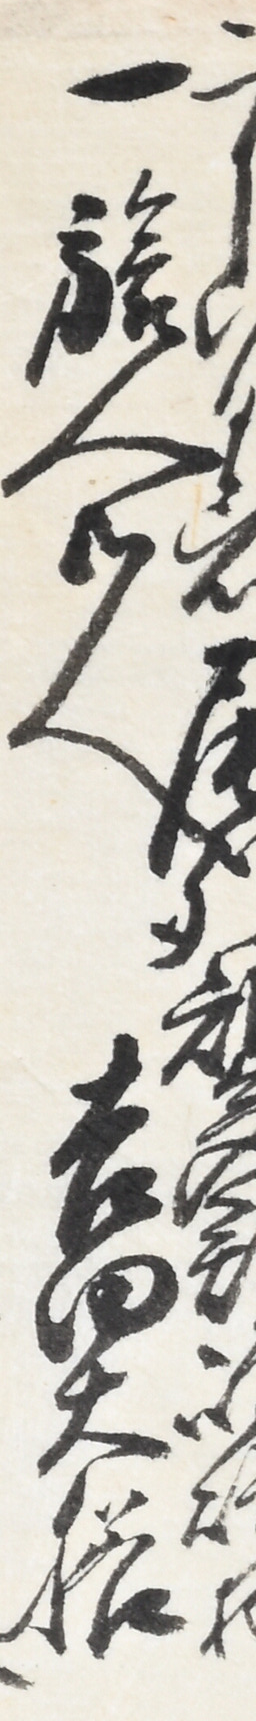一旅人弐人吉田大膳
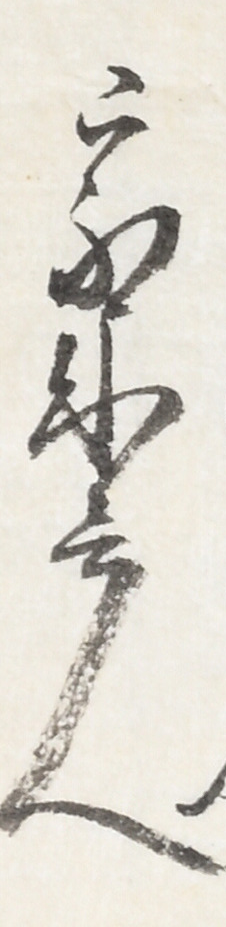家来壱人
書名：旅人泊控帳
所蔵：伊那市立高遠町図書館・合同会社AMANE
